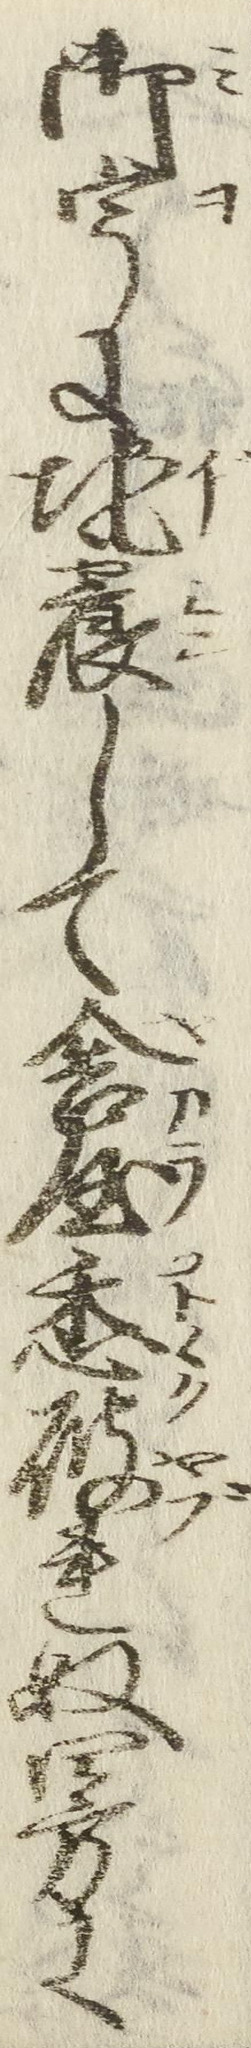御宇に地震して舎屋悉破れぬ四方に
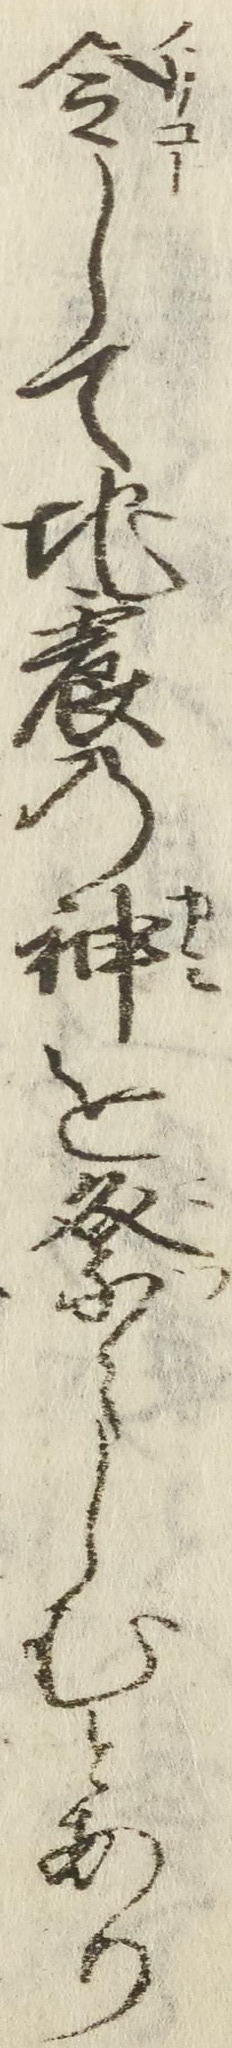令して地震の神を祭らしむとあり
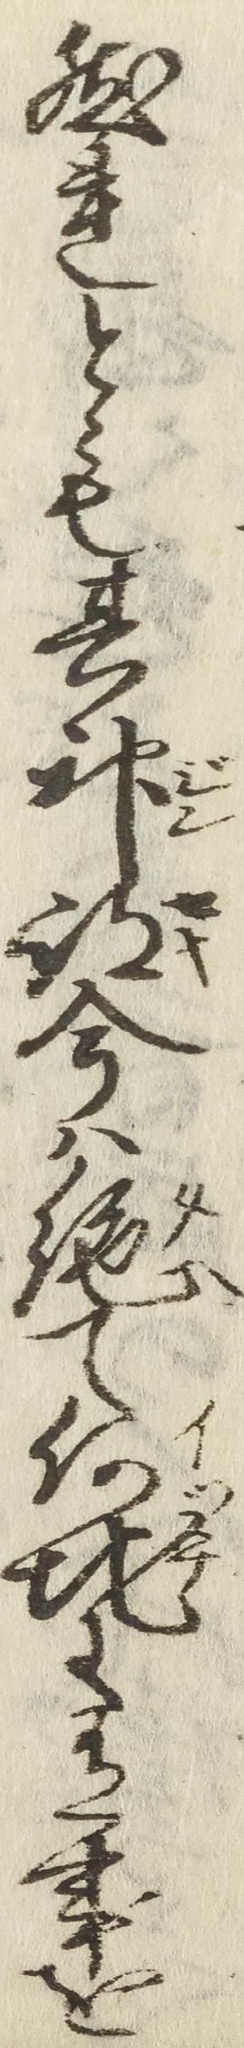然れとも其神跡今は絶て何地に有事を
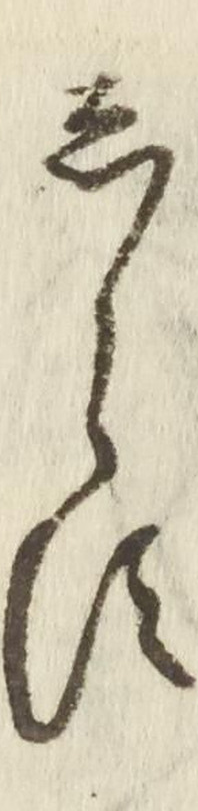しらす
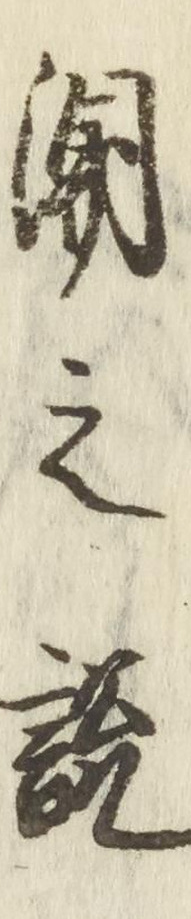潮の説
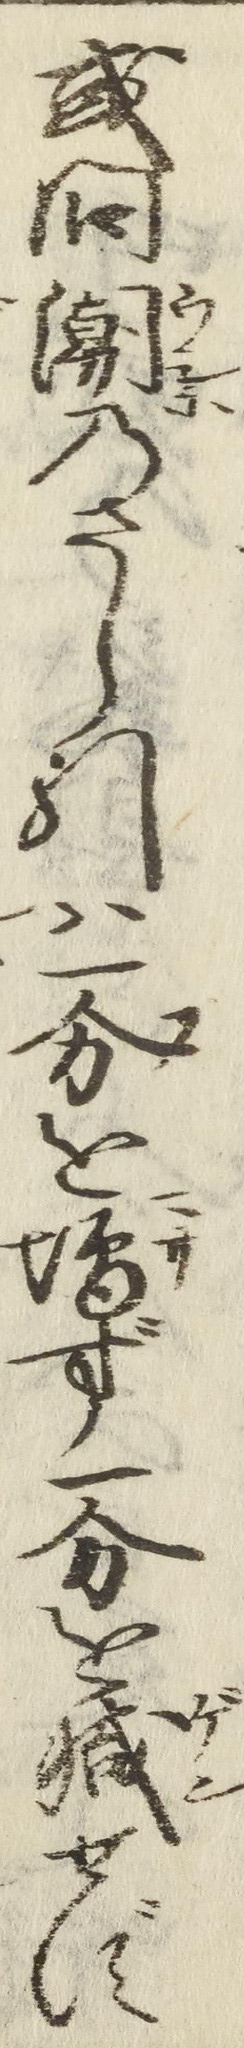或問潮のさし引は一分を増ず一分を減せず
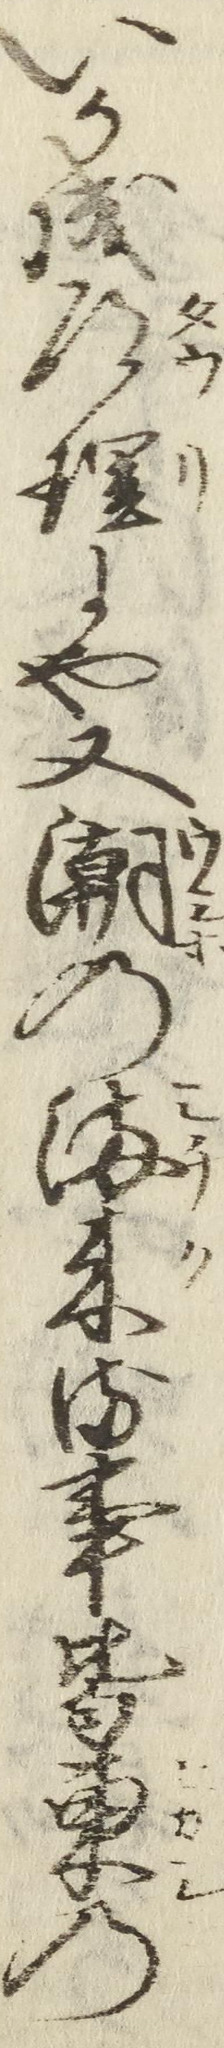いか成道理にや又潮の満来る事皆東の
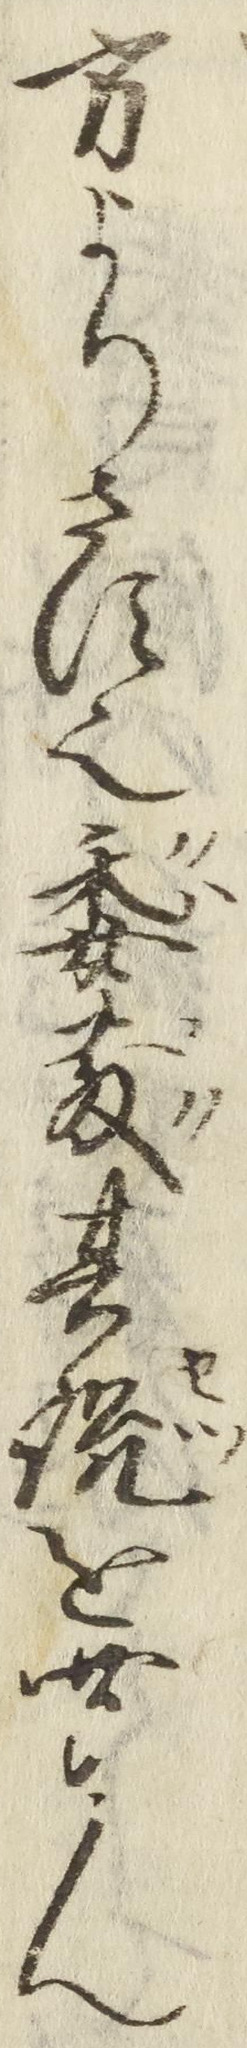方よりさす也委敷其説を聞ん

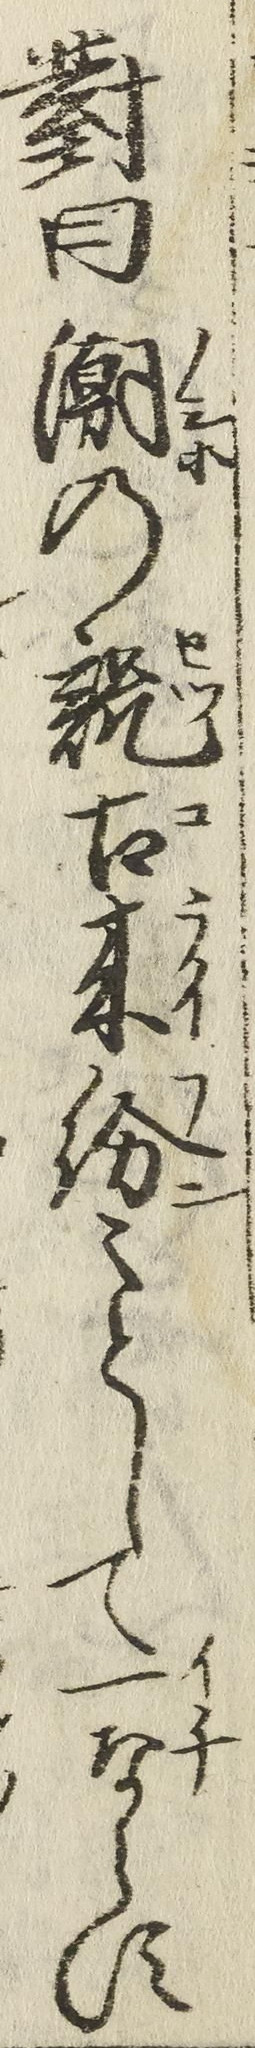対曰潮の説古来紛〻として一ならす
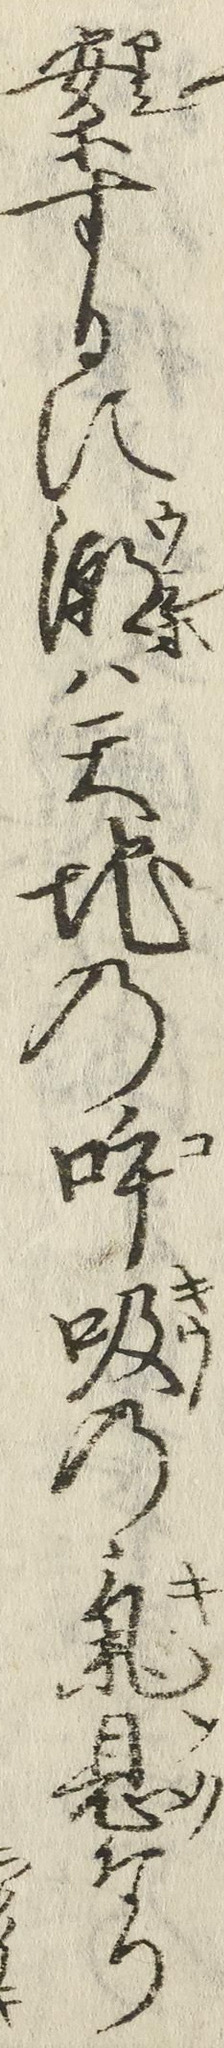案するに潮は天地の呼吸の気息なり
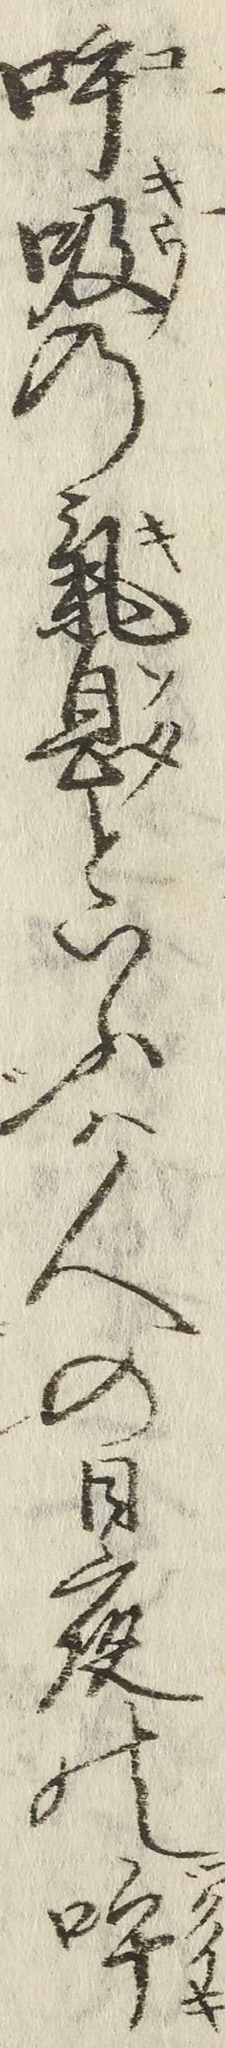呼吸の気息といふは人の日夜の呼
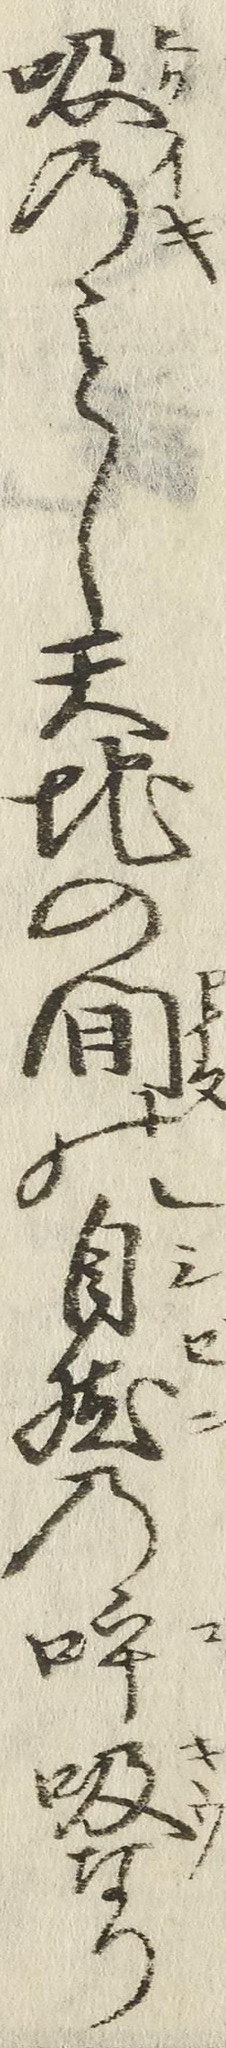吸のことし天地の間の自然の呼吸なり
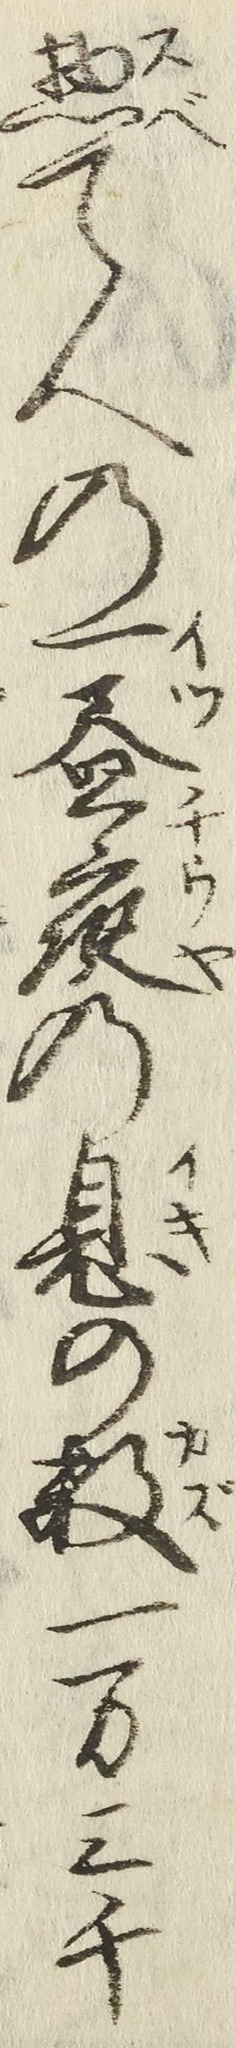惣て人の一昼夜の息の数一万三千
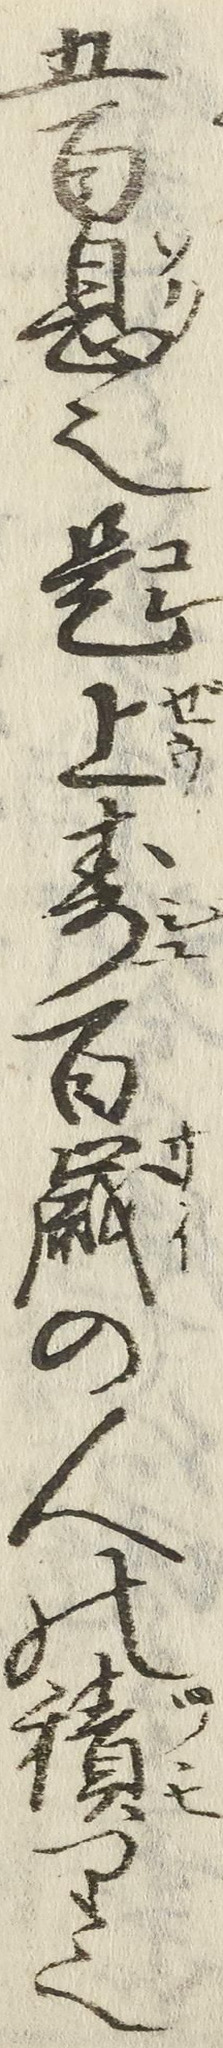五百息也是上寿百歳の人の積り也
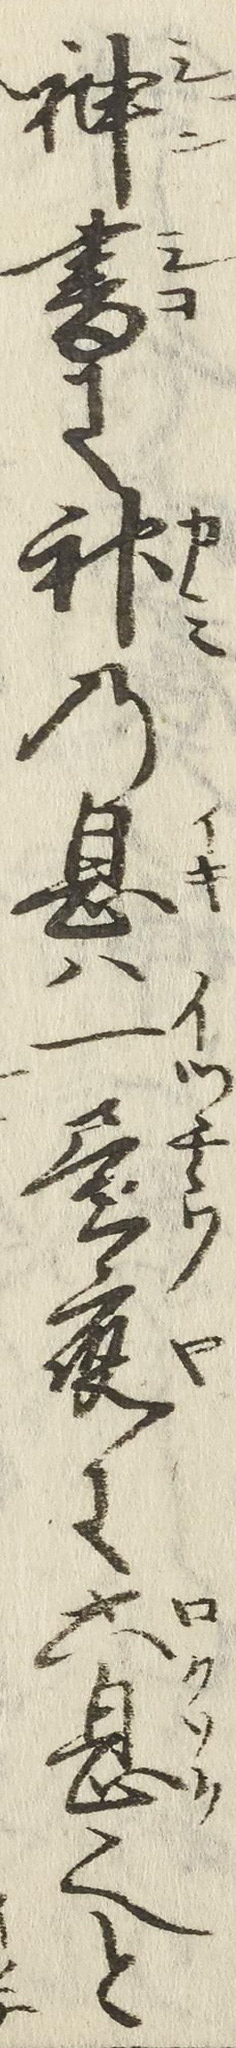神書に神の息は一昼夜に六息也と
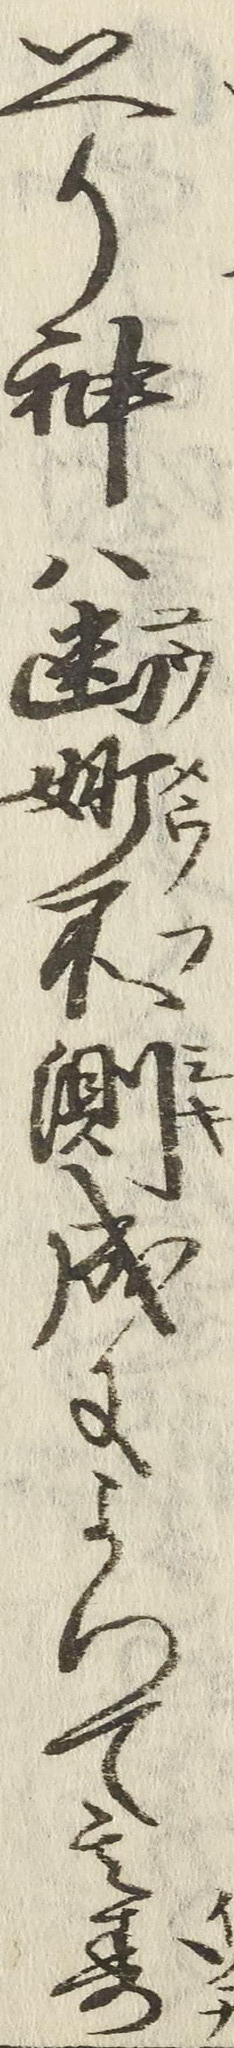いへり神は幽妙不測成によつて其寿
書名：天地或問珍　天
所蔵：東京大学地震研究所図書室 Earthquake Research Institute Library, The University of Tokyo, JAPAN
